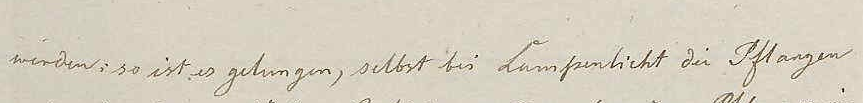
werden: so ist es gelungen, selbst bei Lampenlicht die Pflanzen
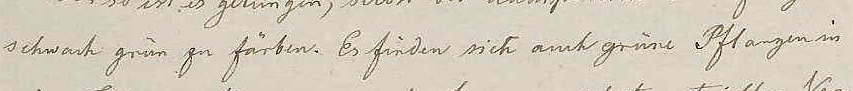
schwach grün zu färben. Es finden sich auch grüne Pflanzen in
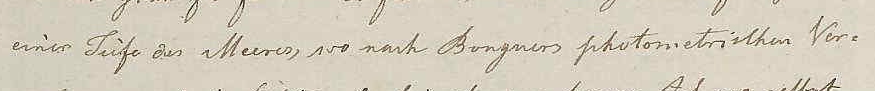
einer Tiefe des Meeres, wo nach Bouguers photometrischen Ver-
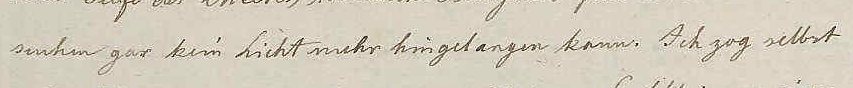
suchen gar kein Licht mehr hingelangen kann. Ich zog selbst
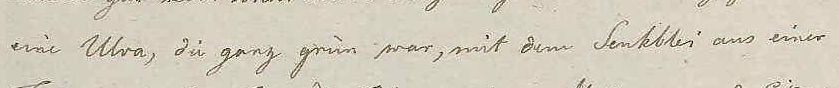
eine Ulva, die ganz grün war, mit dem Senkblei aus einer
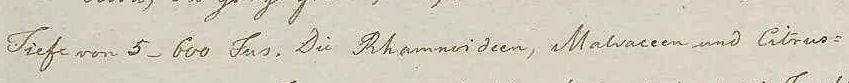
Tiefe von 5–600 Fus. Die Rhamnoideen, Malvaceen und Citrus-
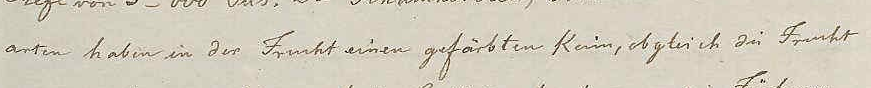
arten haben in der Frucht einen gefärbten Keim, obgleich die Frucht
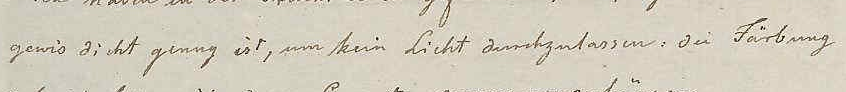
gewis dicht genug ist, um kein Licht durchzulassen: die Färbung
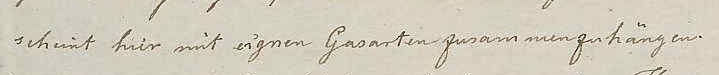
scheint hier mit eignen Gasarten zusammenzuhängen.
